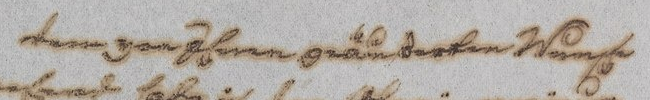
Dem von Ihnen geäußerten Wunsche
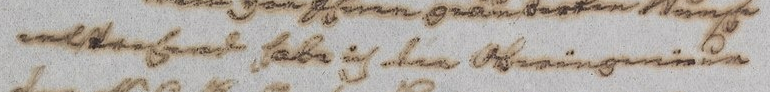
entsprechend habe ich den Oberingenieur
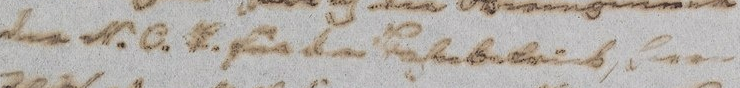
der N.O.B. für den Bahnbetrieb, Herrn
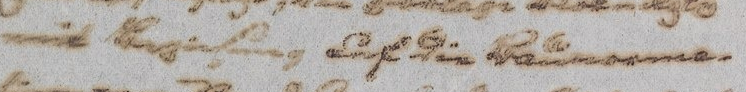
mit Beziehung auf die Baunorma-
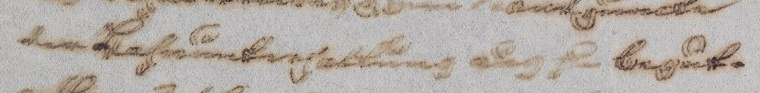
der Bahnunterhaltung aus zu begut-
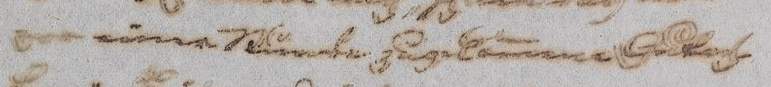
vor einer Stunde zugekommene Gutach-
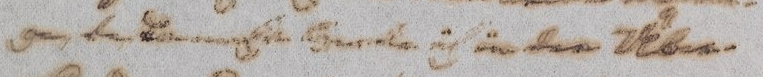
ge, desto mehr werde ich in der Über-
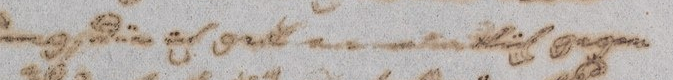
zeugung, die ich gestern namentlich gegen
